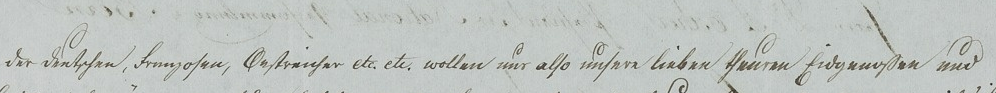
der Deutschen, Franzosen, Oestreicher etc. etc. wollen uns also unsere lieben theuren Eidgenossen und
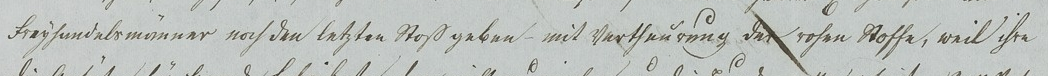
Freyhandelsmänner noch den letzten Stoß geben – mit Vertheurung der rohen Stoffe, weil ihre
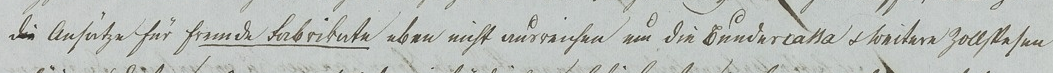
die Ansätze für fremde Fabrikate eben nicht ausreichen um die Bundescassa & weitere Zollspesen
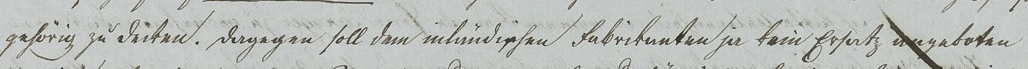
gehörig zu decken. Dagegen soll dem inländischen Fabrikanten ja kein Ersatz angeboten
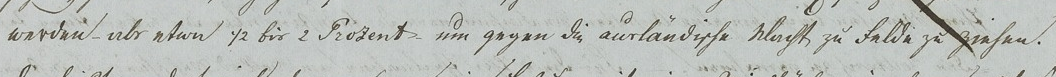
werden – als etwa ½ bis 2 Prozent – um gegen die ausländische Macht zu Felde zu ziehen.
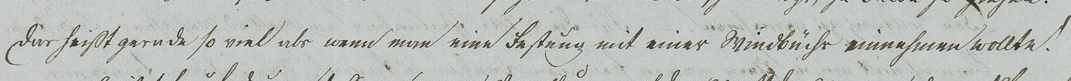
Das heißt gerade so viel als wenn man eine Festung mit einer Windbüchs einnehmen wollte!
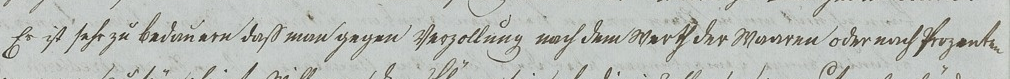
Es ist sehr zu bedauern daß man gegen Verzollung nach dem Werth der Waaren oder nach Prozenten
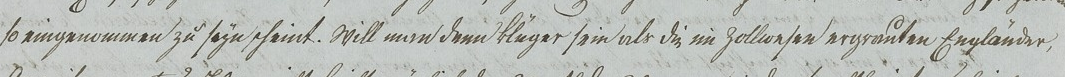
so eingenommen zu seyn scheint. Will man denn klüger sein als die im Zollwesen ergrauten Engländer,
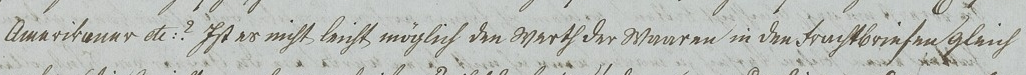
Amerikaner etc: ? Ist es nicht leicht möglich den Werth der Waaren in den Frachtbriefen gleich
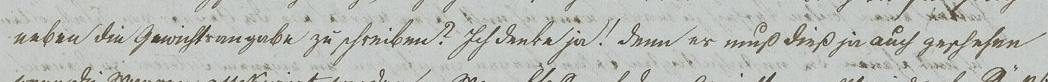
neben die Gewichtsangabe zu schreiben? Ich denke ja! denn es muß dieß ja auch geschehen
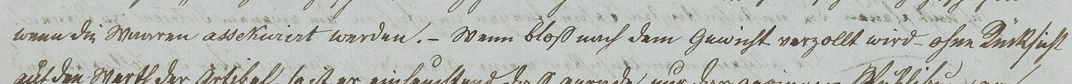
wenn die Waaren assekurirt werden. – Wenn bloß nach dem Gewicht verzollt wird – ohne Rücksicht
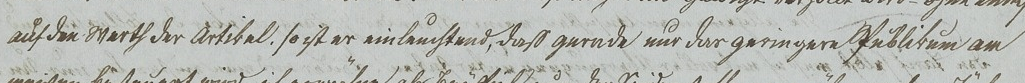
auf den Werth der Artikel, so ist es einleuchtend, daß gerade nur das geringere Publikum am
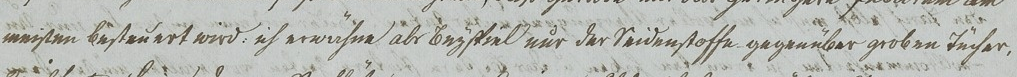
meisten besteuert wird: ich erwähne als Beyspiel nur der Seidenstoffe gegenüber groben Tücher,
